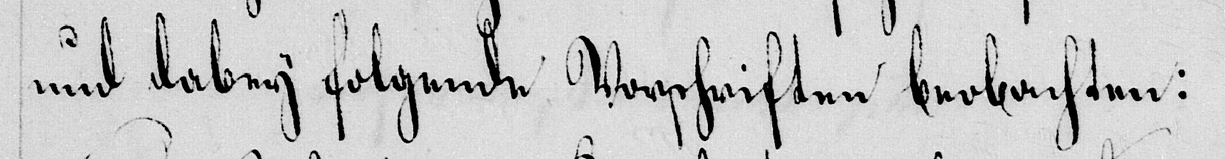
und dabey folgende Vorschriften beobachten:
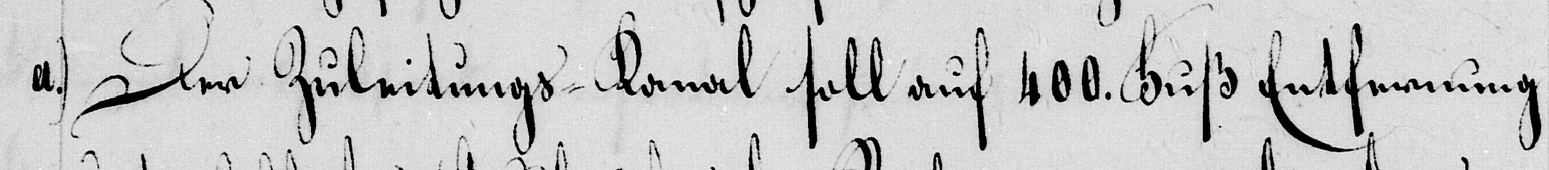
a.) Der Zuleitungs-Kanal soll auf 400. Fuß Entfernung
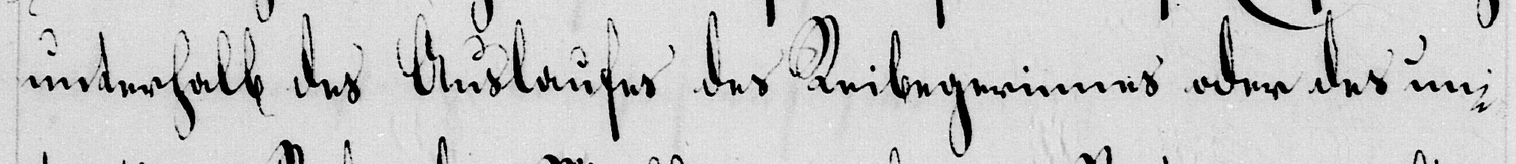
unterhalb des Auslaufes des Reibegerinnes oder des un¬
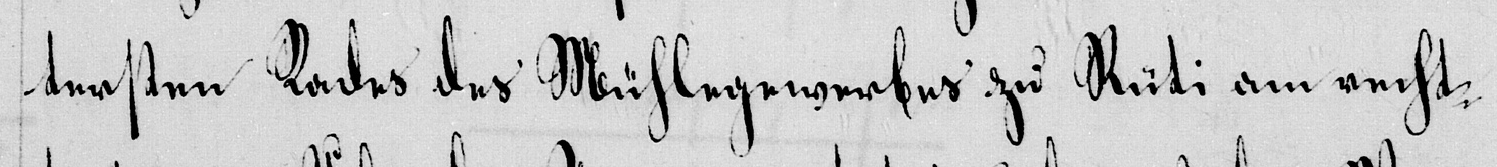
tersten Rades des Mühlegewerbes zu Rüti am recht¬
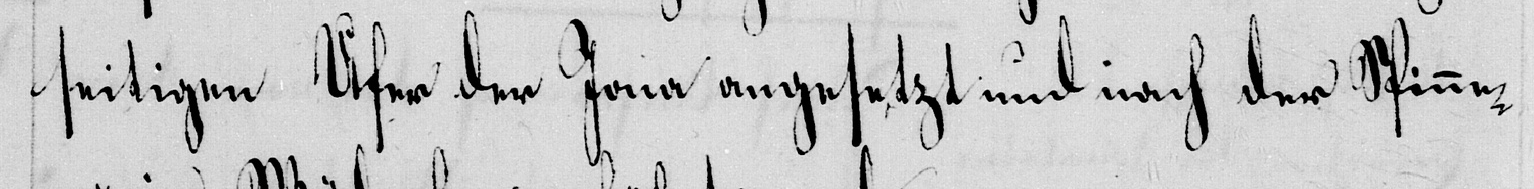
seitigen Ufer der Jona angesetzt und nach der Spinne¬
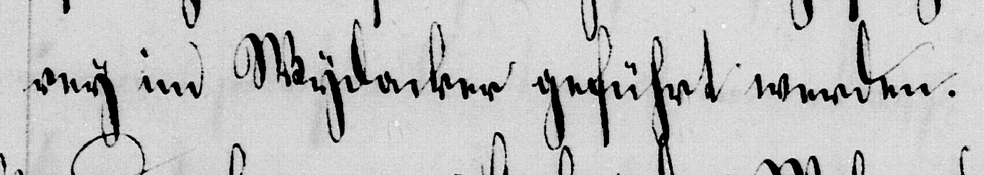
rey im Wydacker geführt werden.
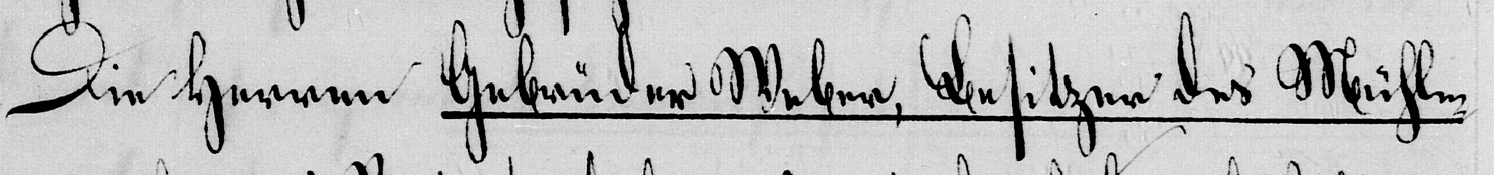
Die Herren Gebrüder Weber, Besitzer des Mühle¬
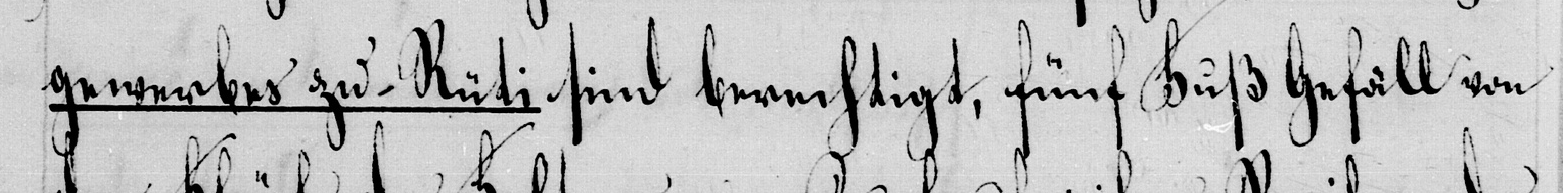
gewerbes zu Rüti sind berechtigt, fünf Fuß Gefäll von
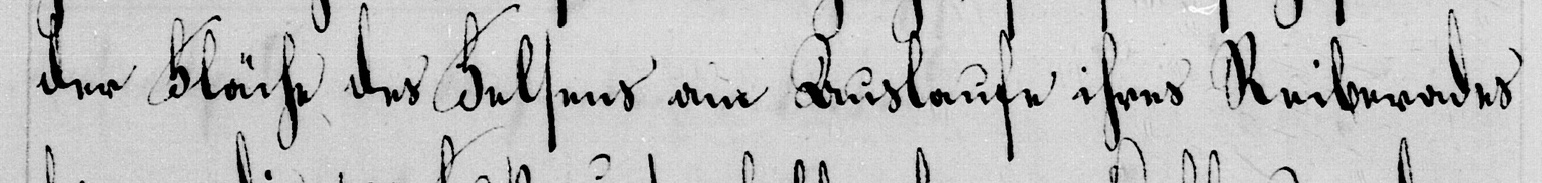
der Fläche des Felsens am Auslaufe ihres Reibrades
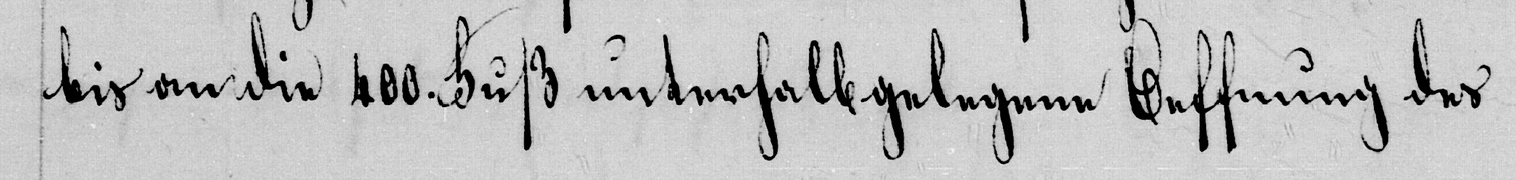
bis an die 400. Fuß unterhalb gelegene Oeffnung des
